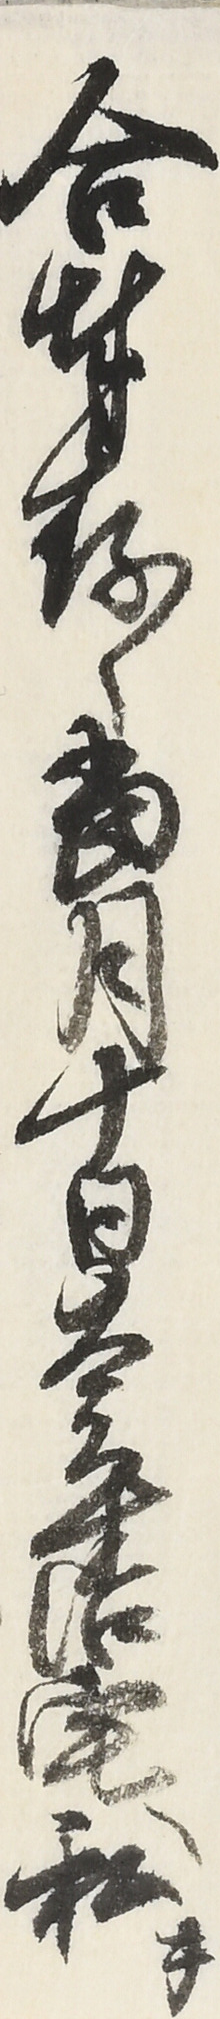合奉存候当月十日太平治宅へ私ヲ
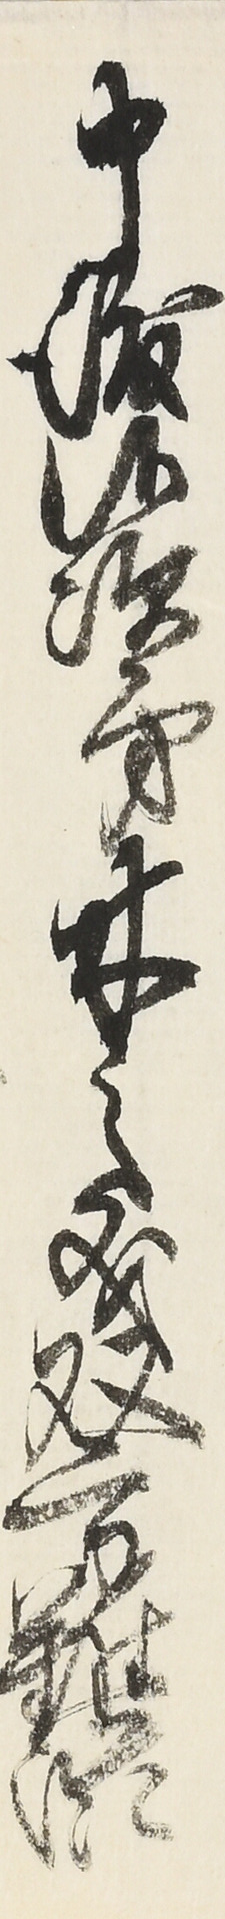申渡候次第木之義双方難渋
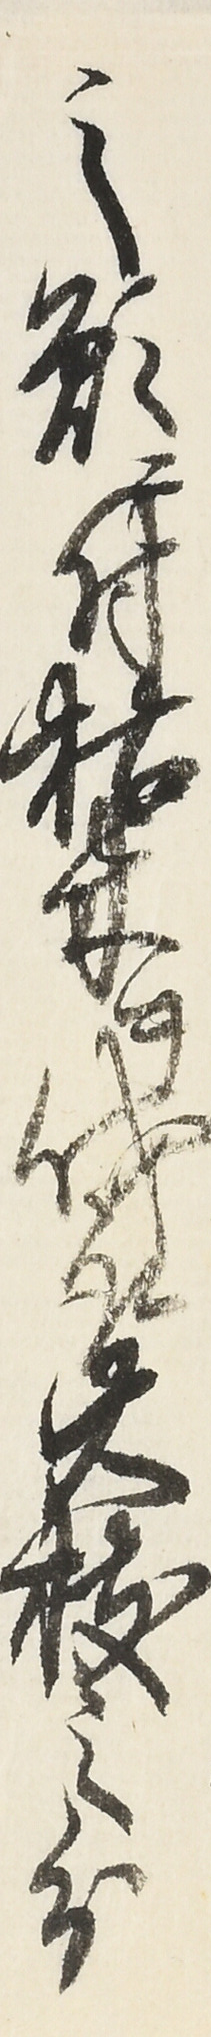之願ニ付枯木ヲ伐取大枝之分
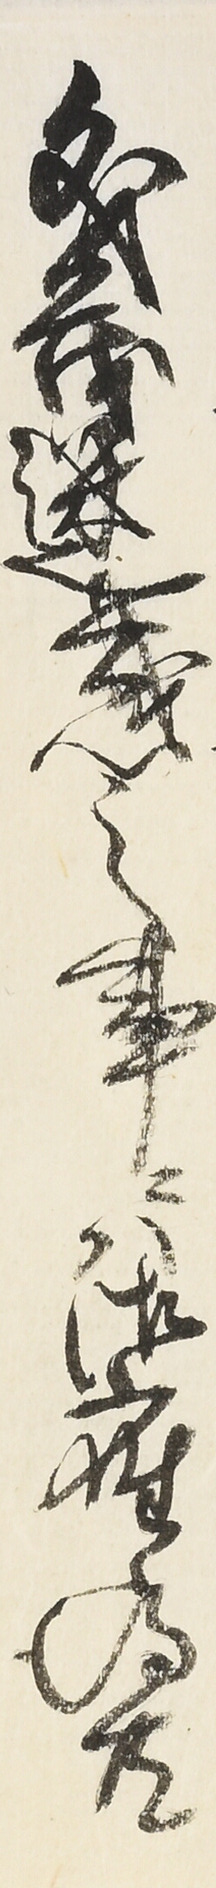義茂迷惑之事ニハ御座候得共
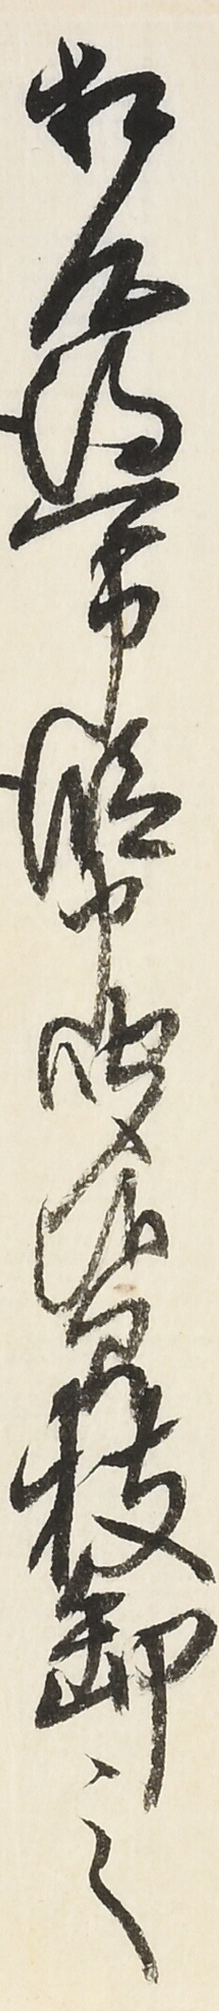相心得可申段申聞候間枝卸之
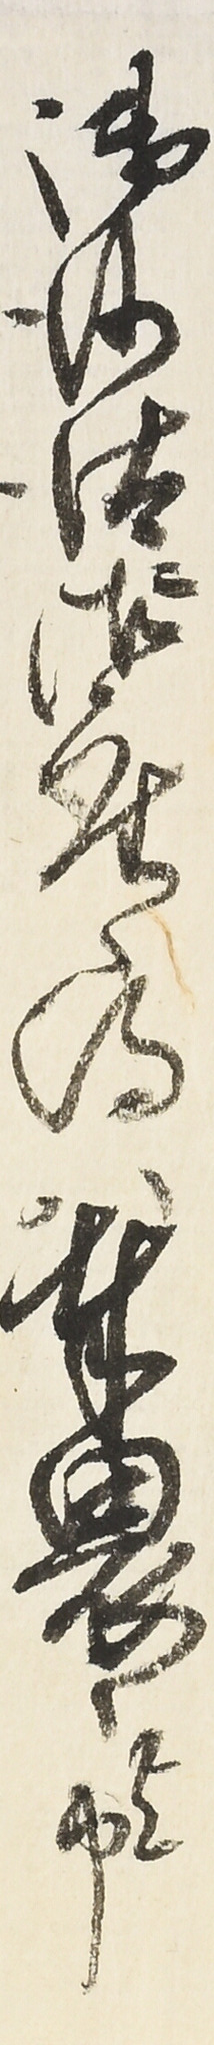御沙汰ニ御座候得ハ奉畏候与申
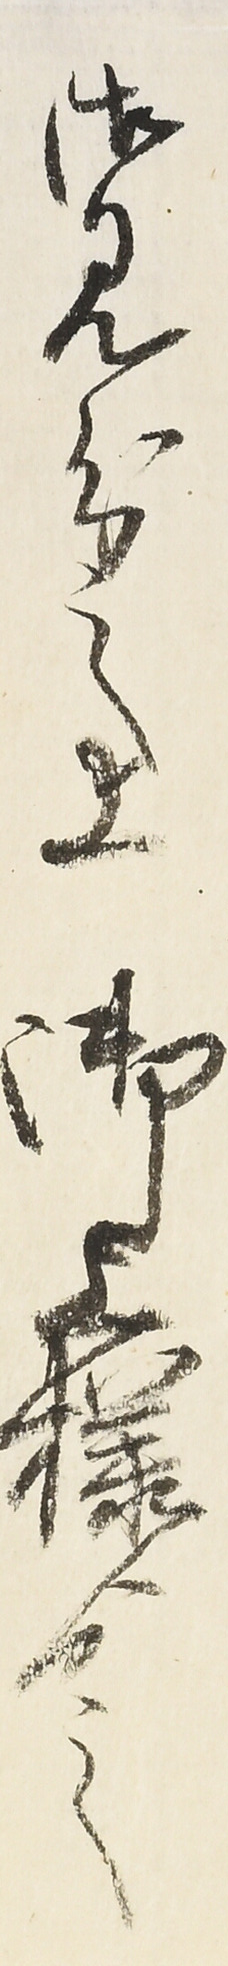御見分之上御上様より之
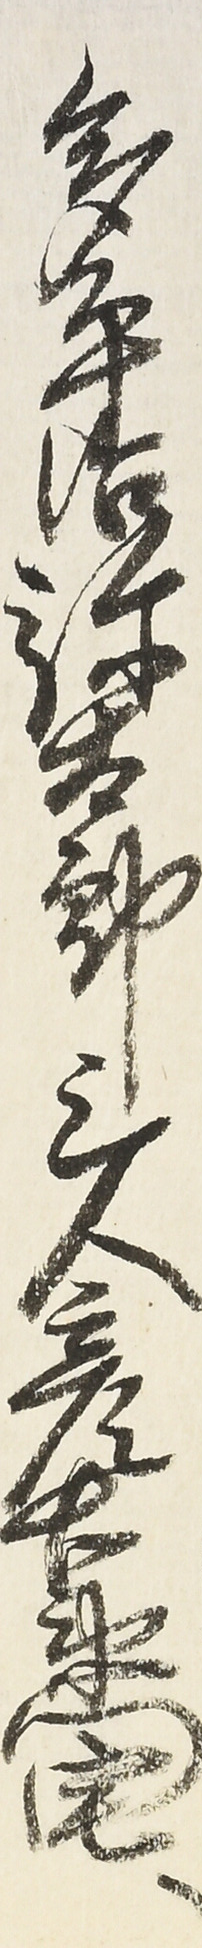多平治弥太郎三人彦右衛門宅へ
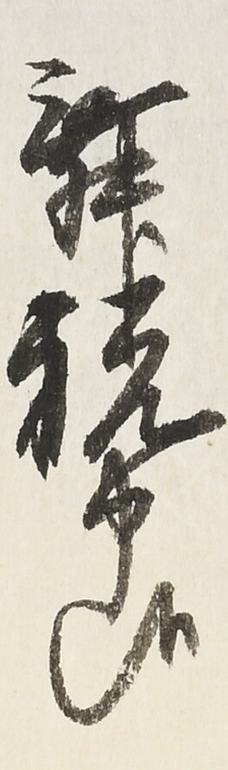舞祝申候
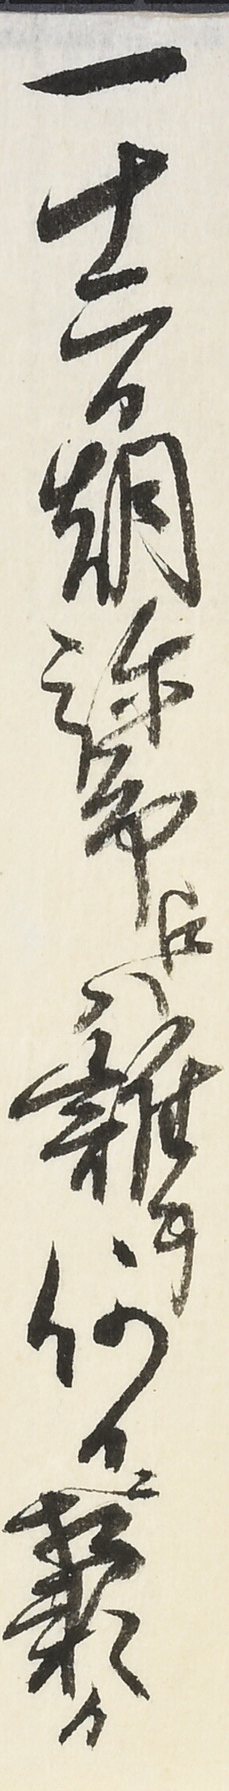一十二日朝弥市江雑ヲ何日ニ相頼候
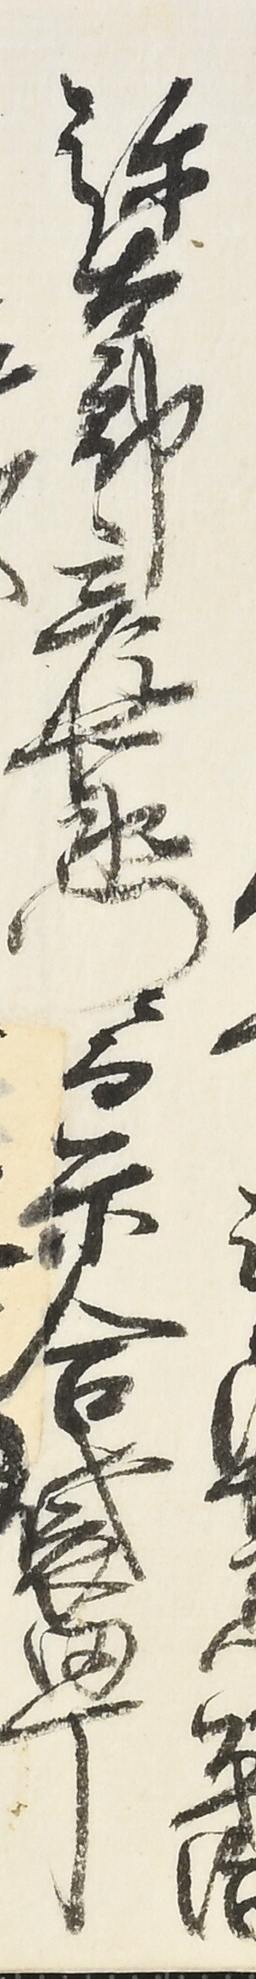弥太郎立彦右衛門ニ而示合袋町
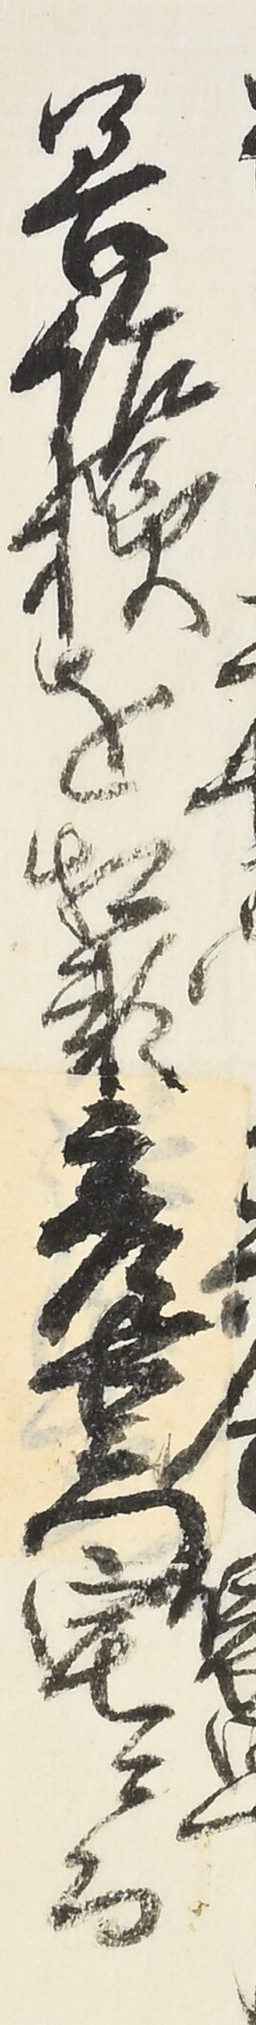善作様を相頼彦右衛門宅ニ而

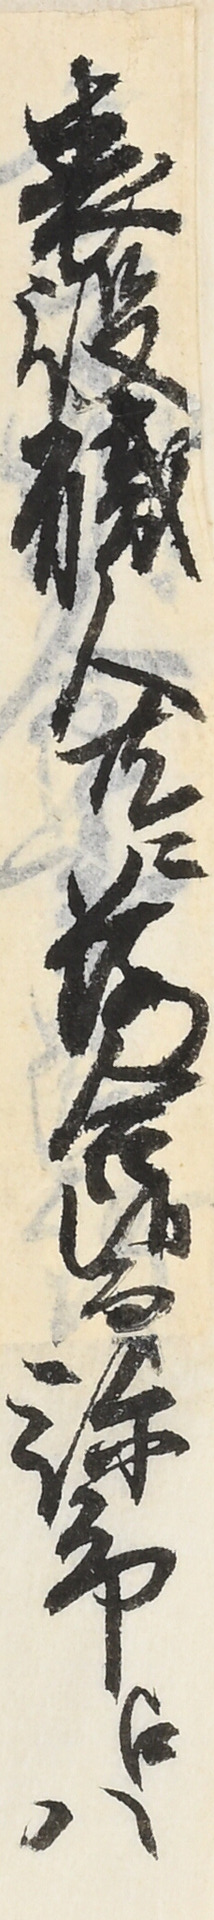表役職人共に落合候而弥市江ハ
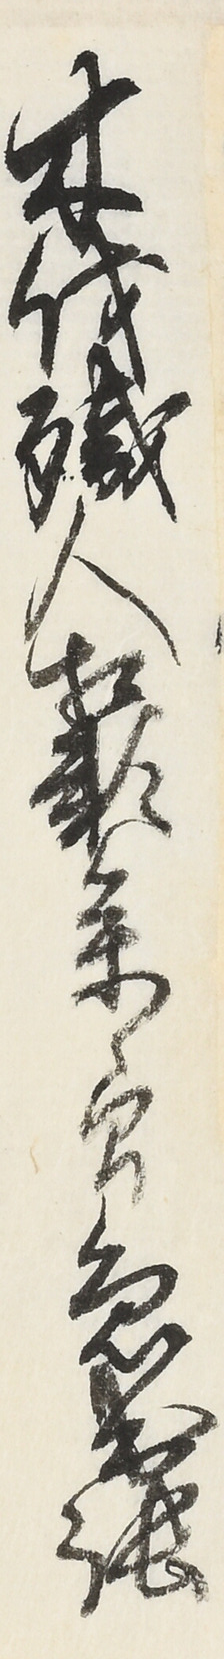木伐職人相頼参り候間急出張
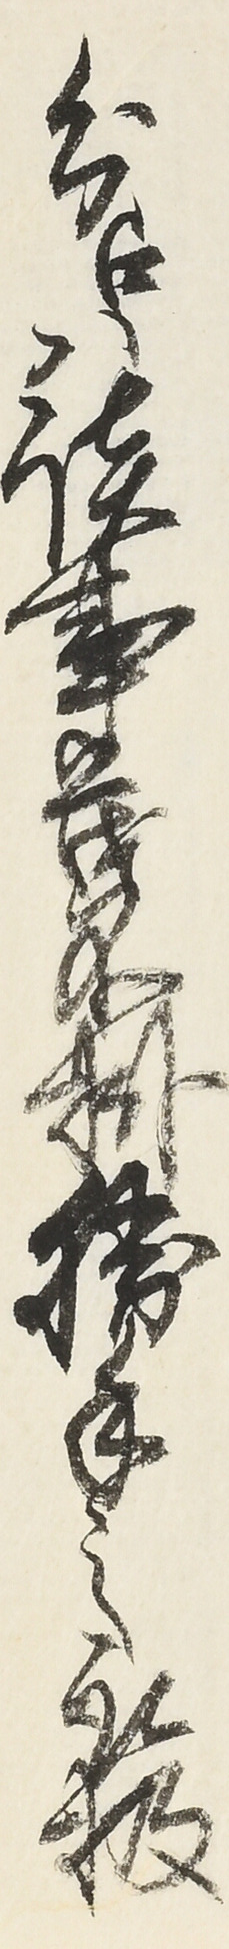分江談事茂不掛勝手之取扱
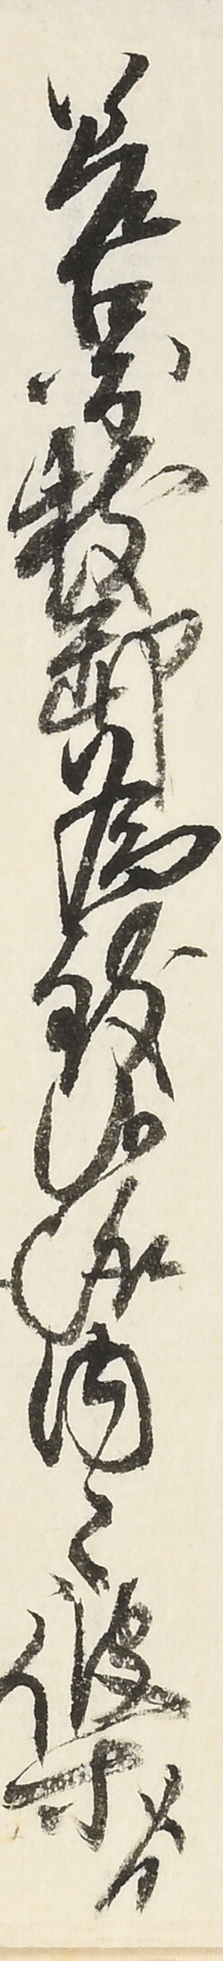差図枝卸為致候趣内々彼等より
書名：乍恐御内々子委奉申上度口上書
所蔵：伊那市立高遠町図書館・合同会社AMANE
